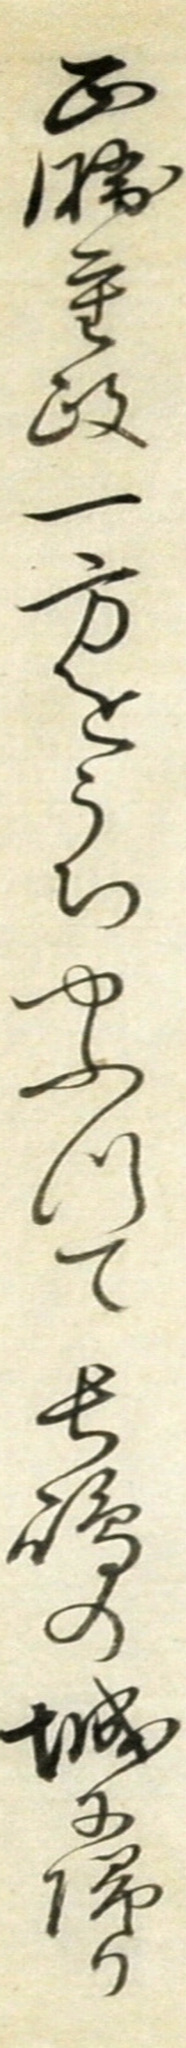正勝重政一方をうちやふつて長島の城に帰り
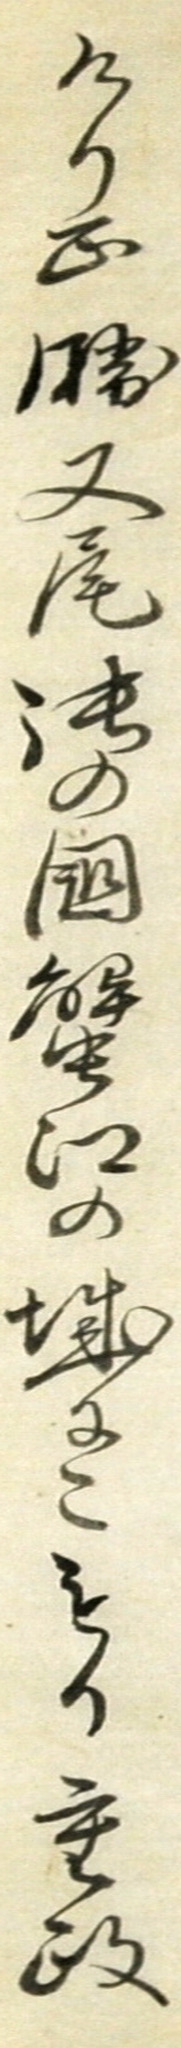けり政勝又尾張の国蟹江の城にこもり重政
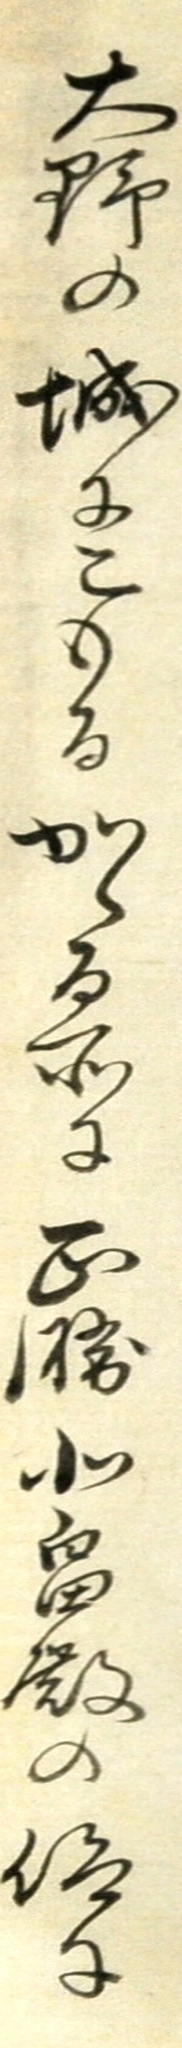大野の城にこもるかゝる所に正勝北畠殿の仰に

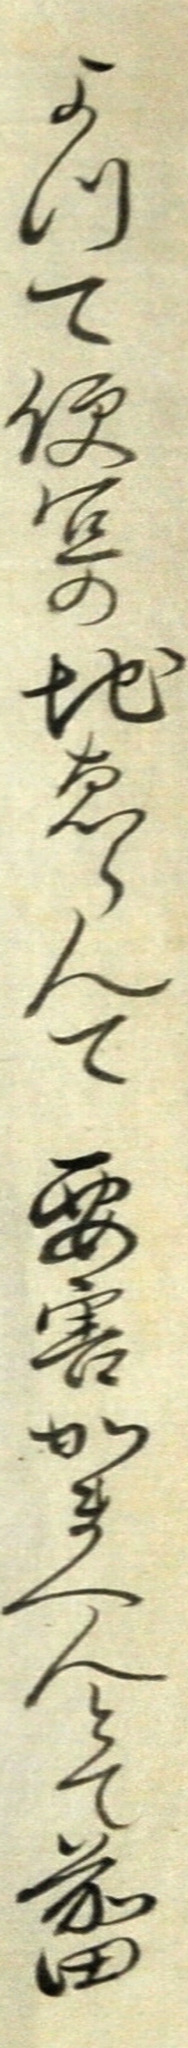よつて便宜の地ゑらんて要害かまへんとて前田
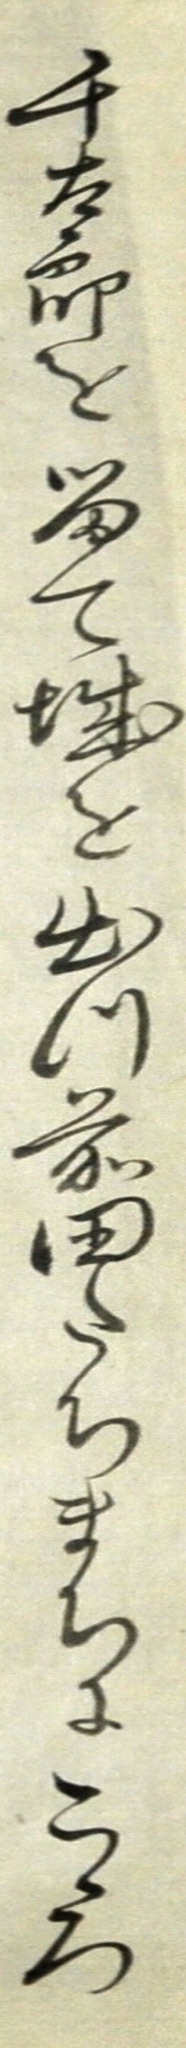千太郎を留て城を出つ前田たちまちにこゝろ
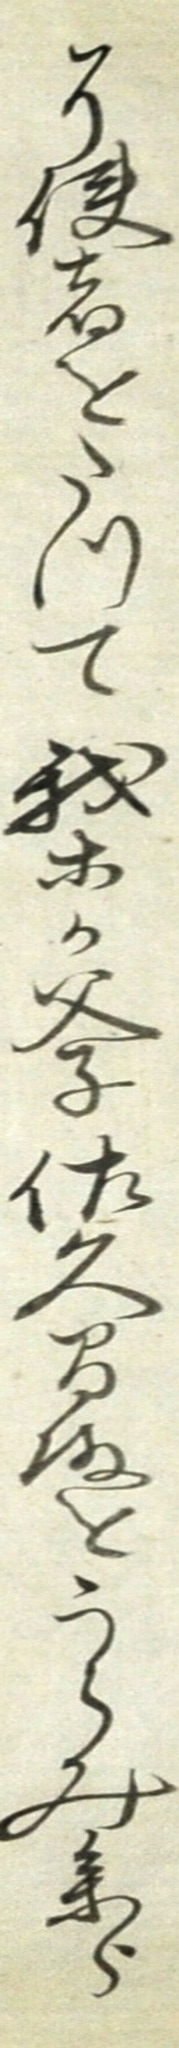に使者をたつて我等か父子佐久間殿をうらみ参ら
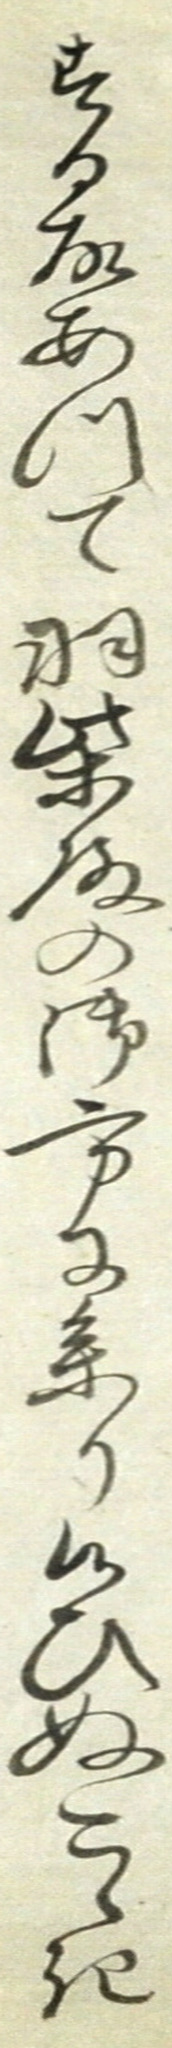する故あつて羽柴殿の御方に参り候ひぬこゝき
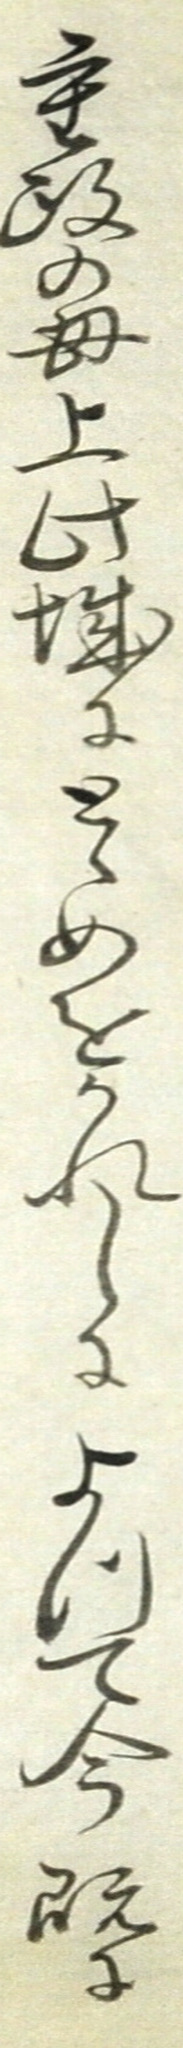重政の母上此城にとゝめをかれしによつて今既に
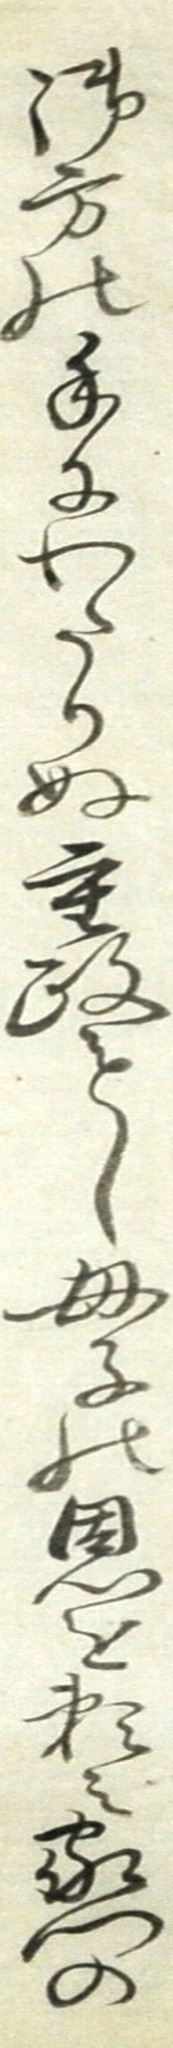御方の手にわたりぬ重政もし母子の恩を頼み家門の
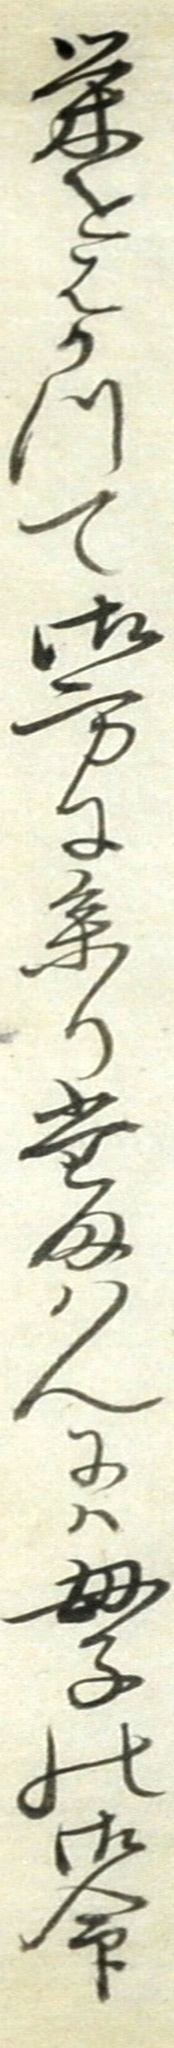栄をはかつて御方に参りたまはんには母子の御命
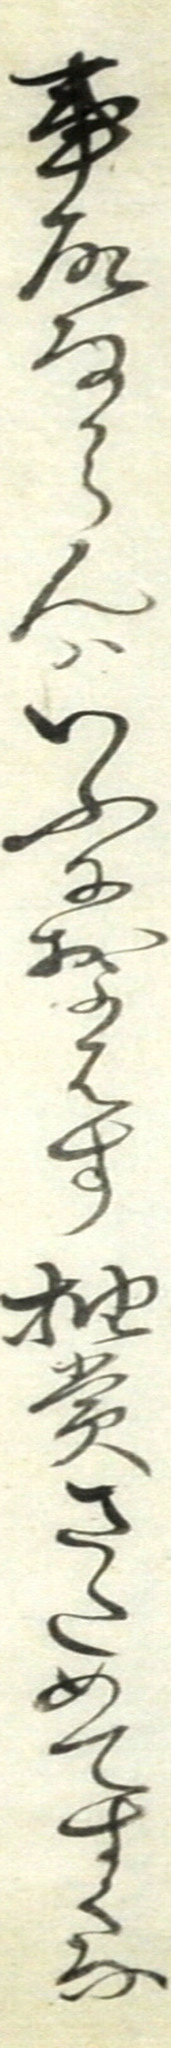事故なからんはいふにおよはす抽賞さためてすくな
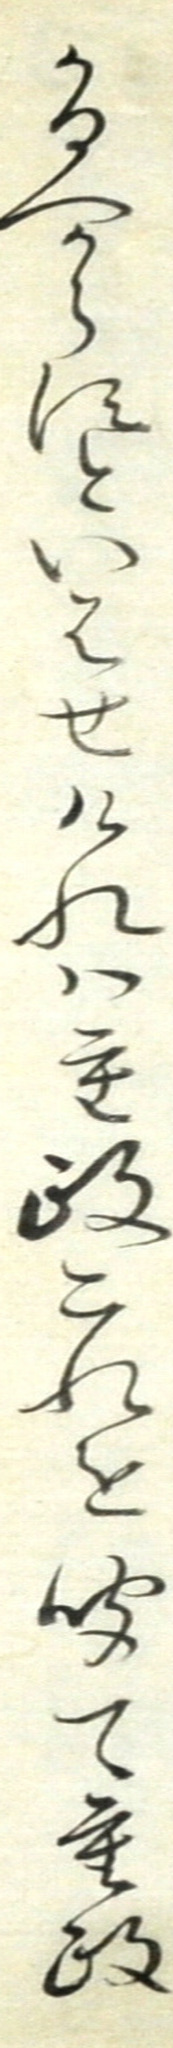かるへからすといはせけれは重政これを聞て重政
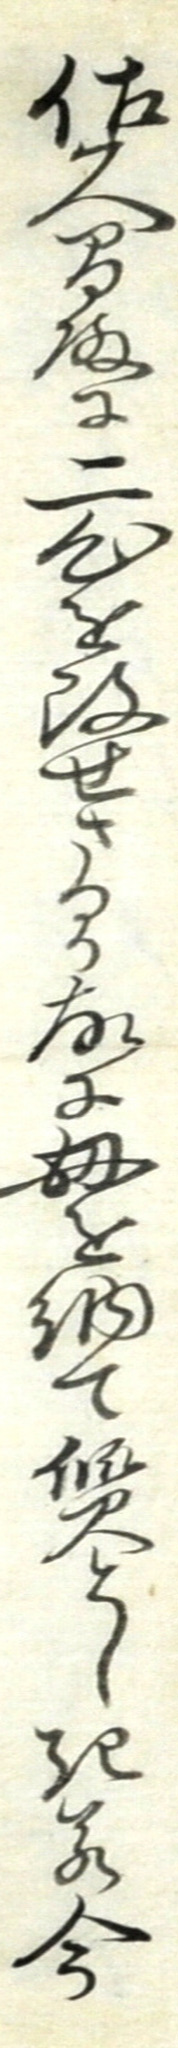佐久間殿に二心を改せさるか故に母を納て質としき若今
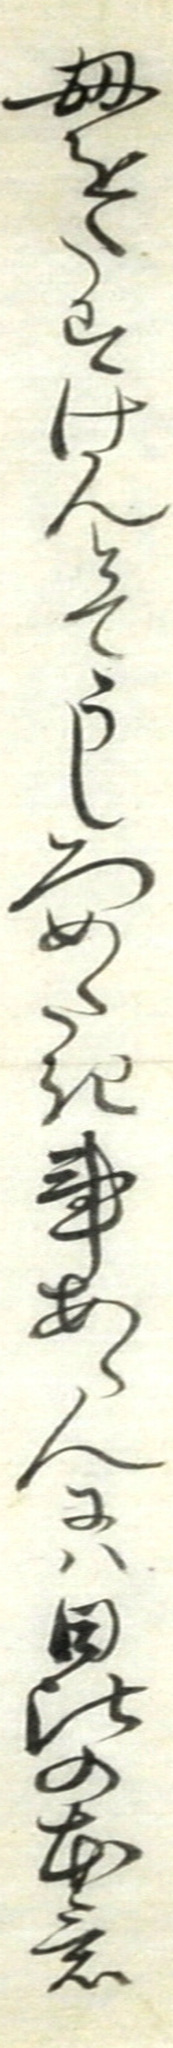母をたすけんとてうしろめたき事あらんには日比の本意
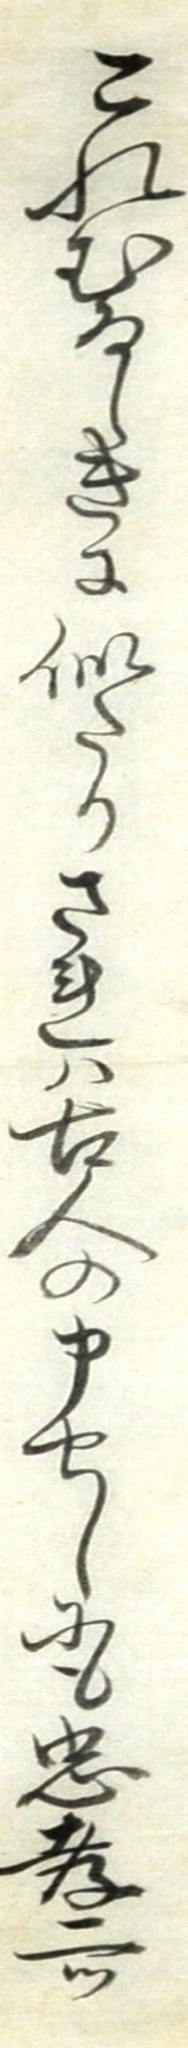これむなしきに似たりされは古人の申せしにも忠孝二ッ
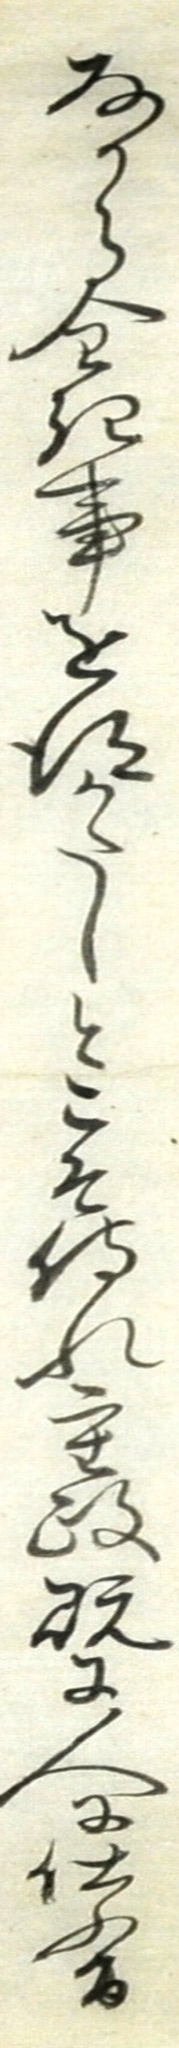なから全き事を得かたしとこそ侍れ重政既に人に仕ふる
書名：藩翰譜（六）
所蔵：伊那市立高遠町図書館・合同会社AMANE
